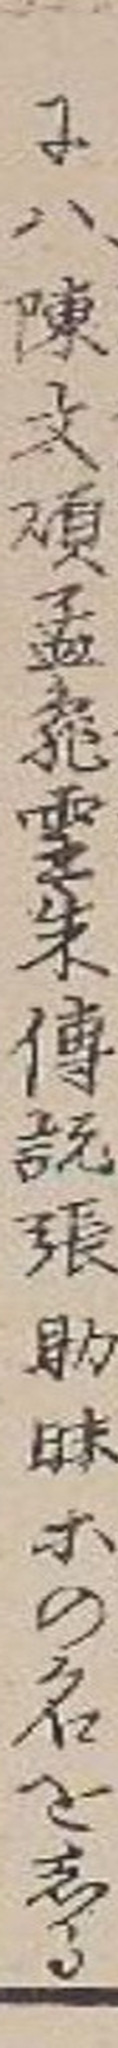には、陳文碩、孟亀霊、朱伝説、張助昧等の名をしる
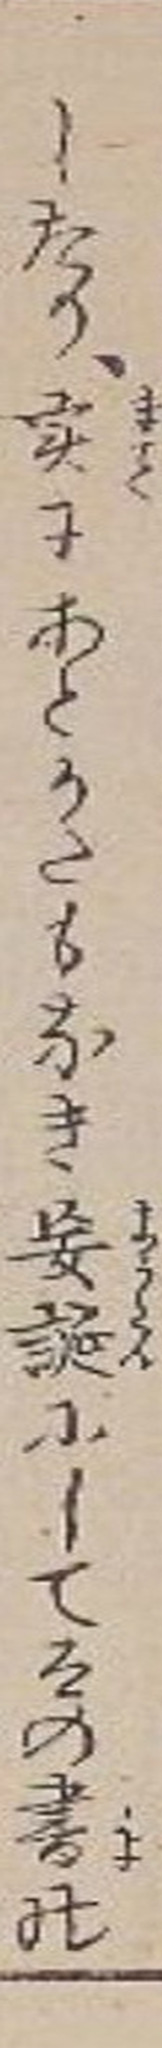したり、実にあとかたもなき妄誕にしてその書の
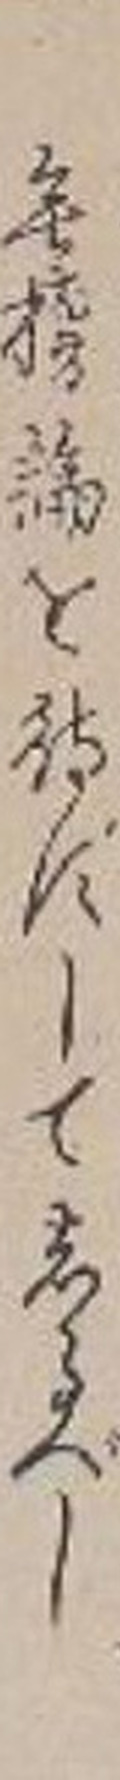無稽論を待ずしてしるべし、
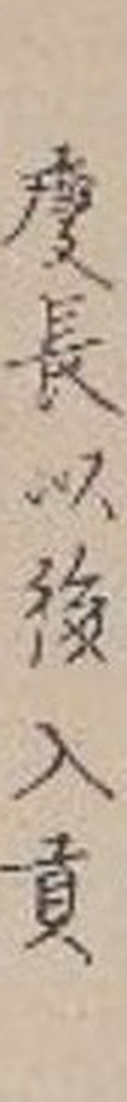慶長以後入貢
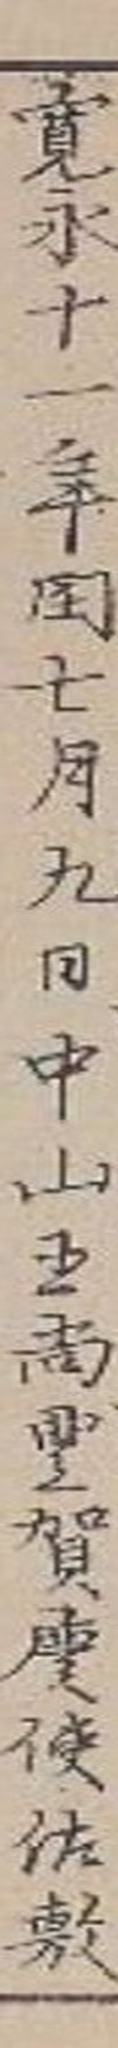寛永十一年閏七月九日、中山王尚、豊賀慶使佐敷
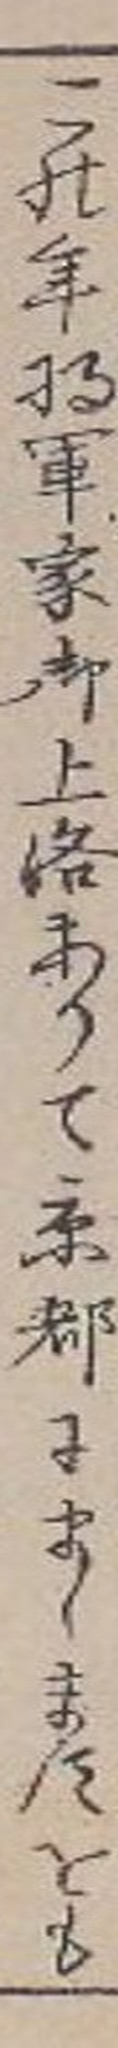この年将軍家御上洛ありて、京都にましますをも
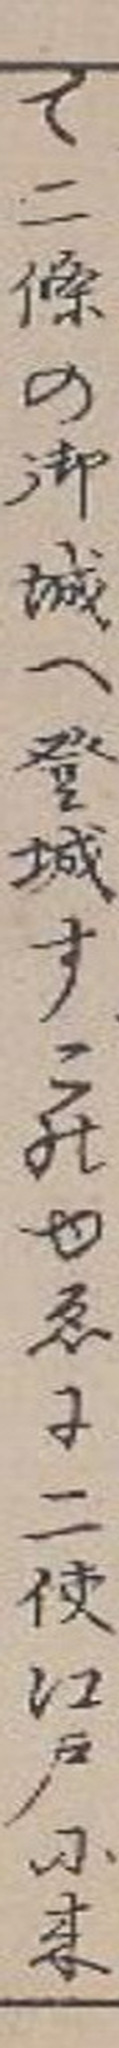て、二条の御城へ登城す、このゆゑに二使江戸に来
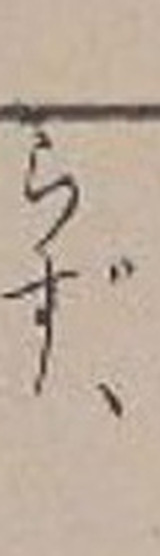らず、
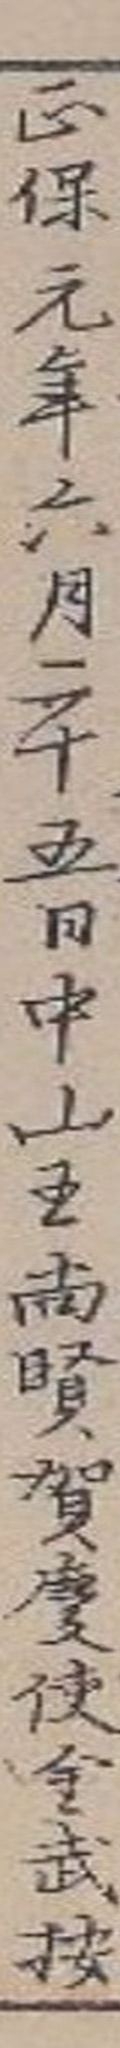正保元年六月二十五日、中山王尚賢、賀慶使金武按

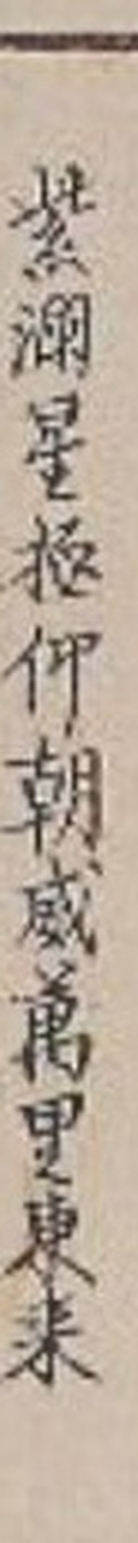紫瀾星極仲朝威万里東来
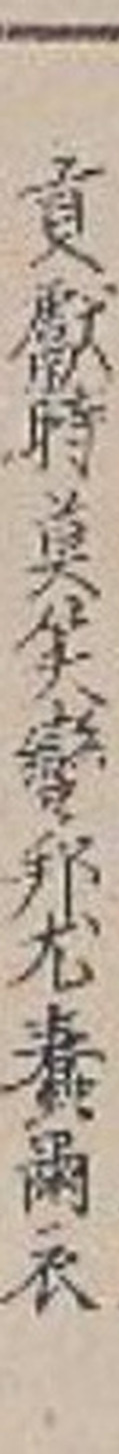貢献時莫笑蛮邦尤蠢爾衣
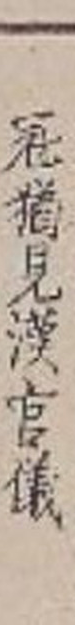冠猶見漢官儀
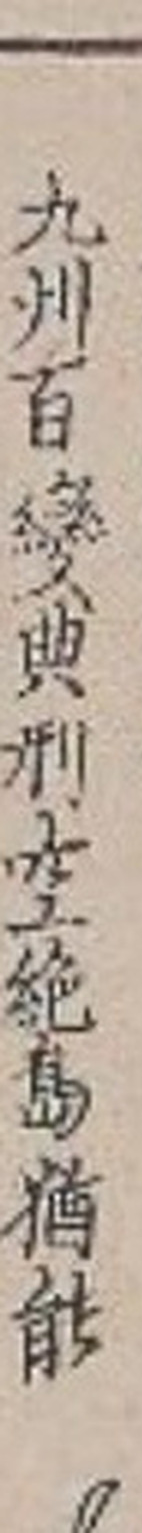九州百変典刑空絶島猶能
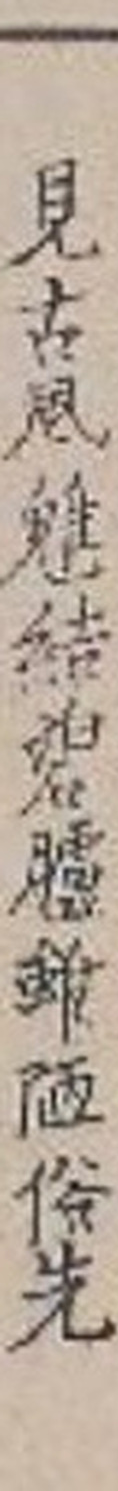見古風魋結碧臚雖陋俗先
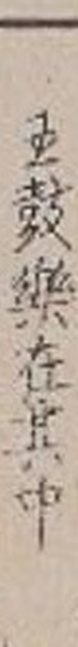王鼓楽在其中
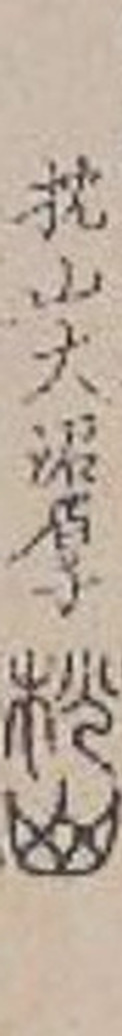枕山大沼厚
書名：琉球入貢紀略
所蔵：University of the Ryukyus Library
